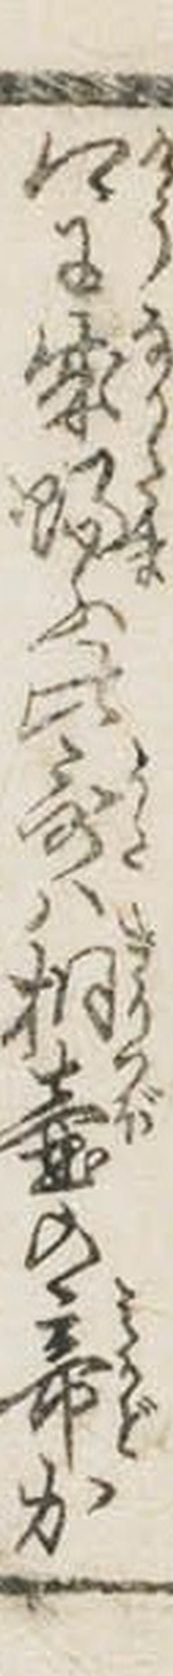卿に成賜ふ此哥は桐壺の帝か
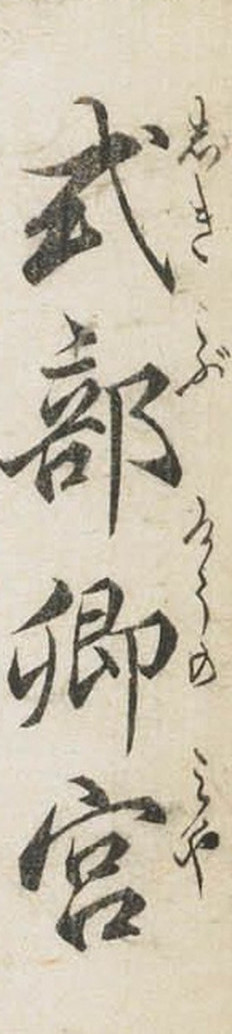式部卿宮
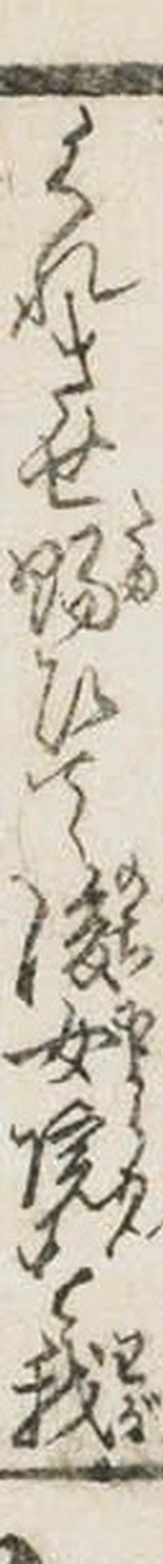くれさせ賜ひて後女院を我
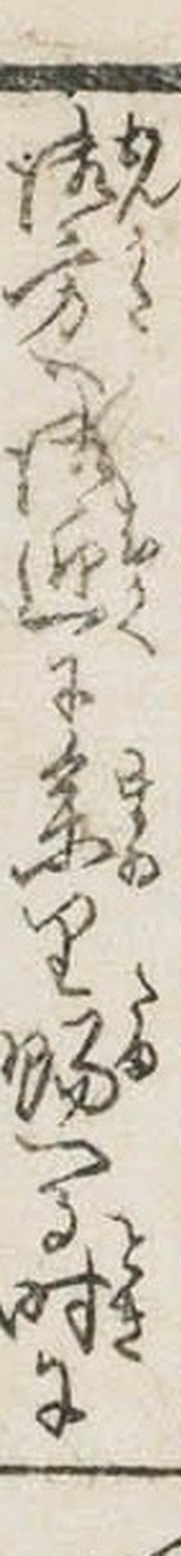御方へ御迎に参り賜へる時に
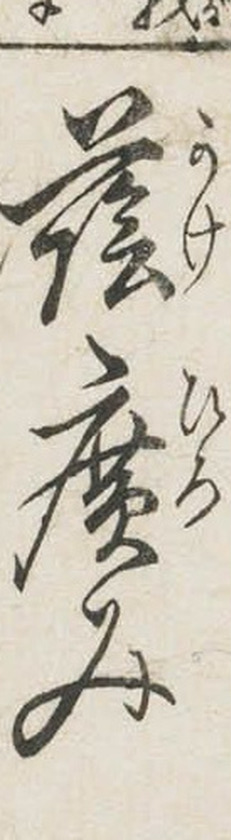蔭広み
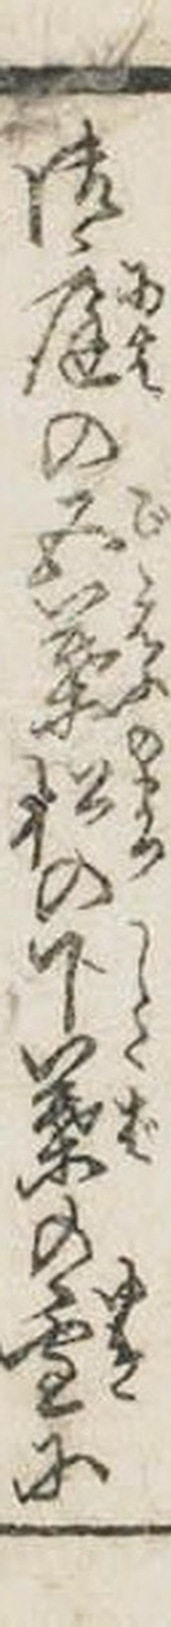御庭の五葉松の下葉の雪に
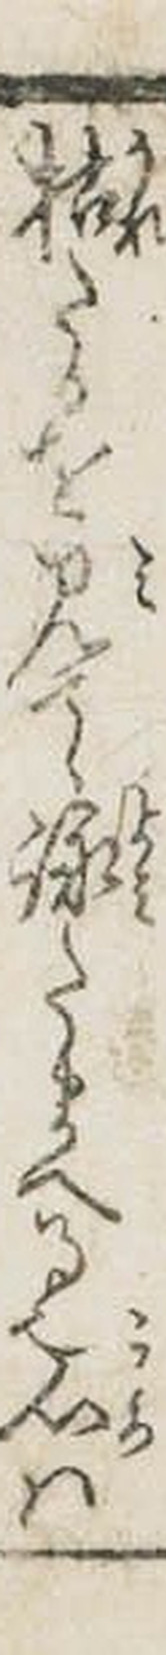枯たるを見て詠たまへる也心は
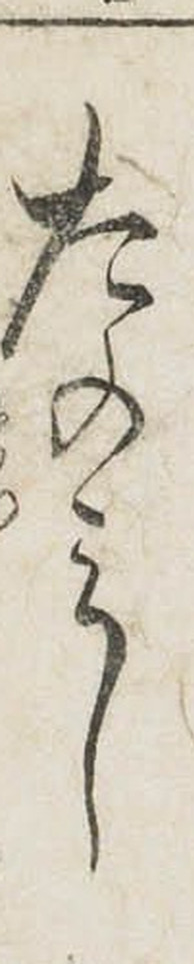たのみし
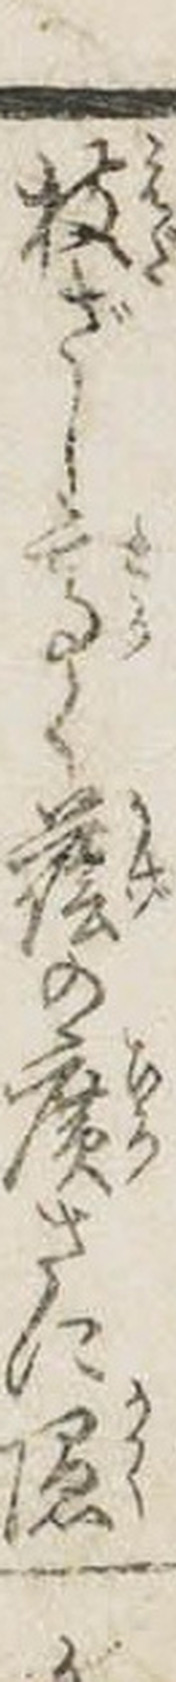枝ざし高く蔭の広さに隠
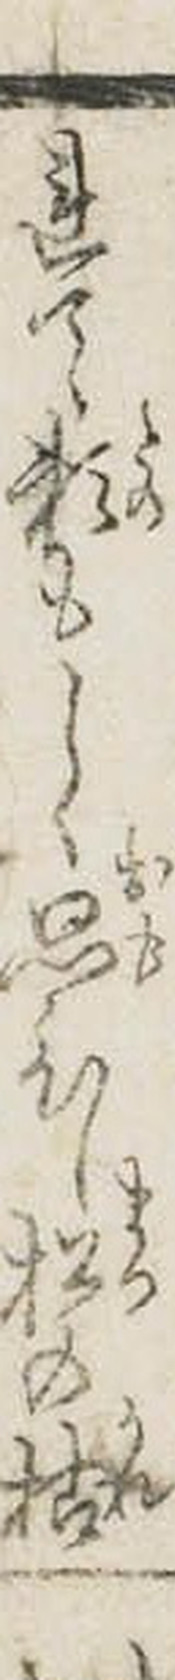れて頼もしく思ひし松の枯
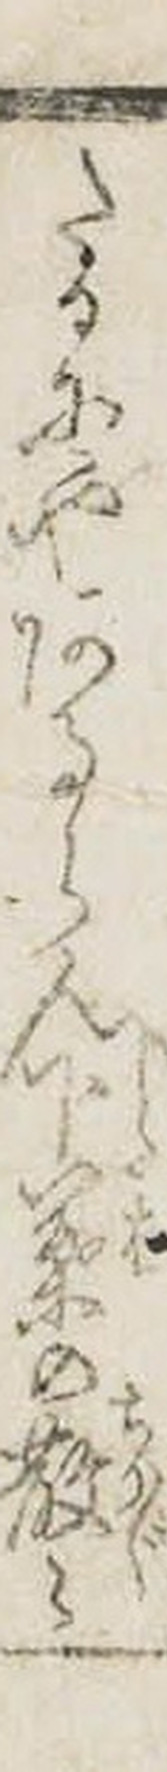たるにやあるらん下葉の散々
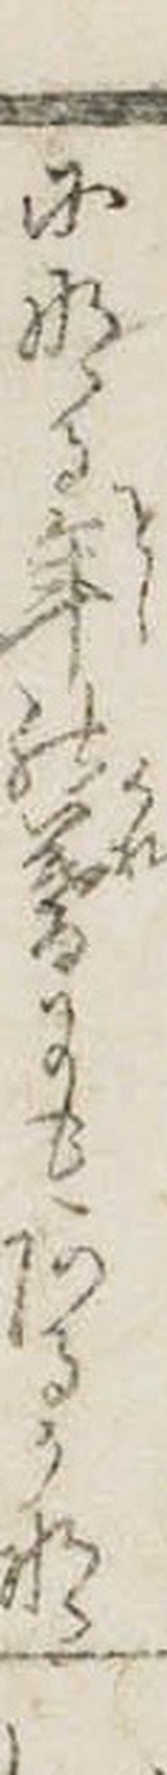になる年の暮にもあるかな
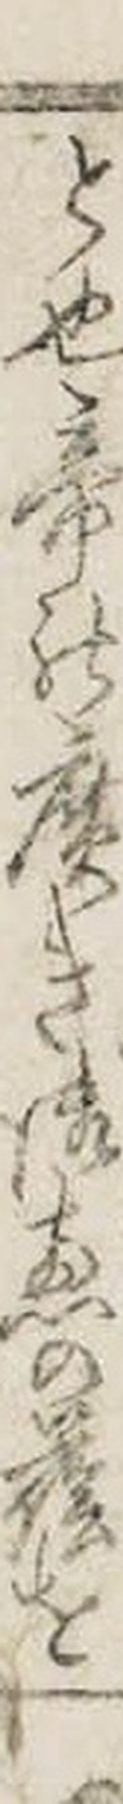と也帝の広き御恵の蔭を
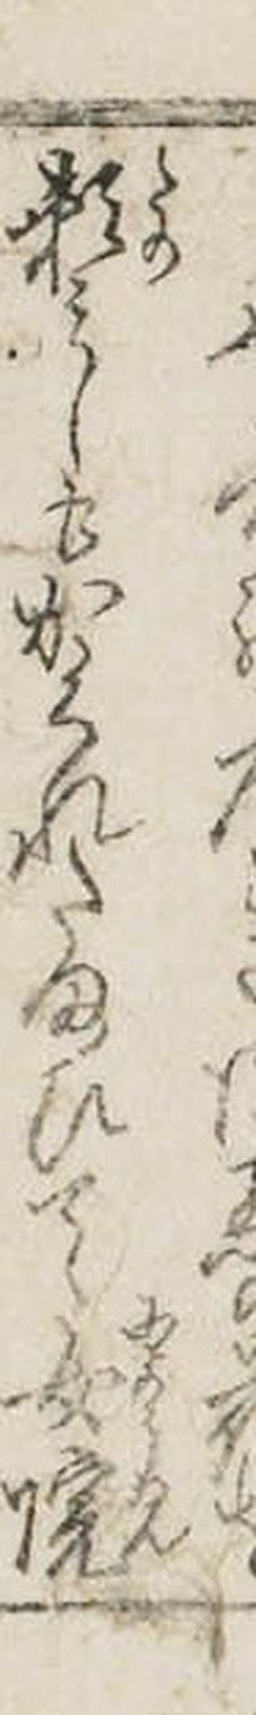頼みしもかくれたまひて女院
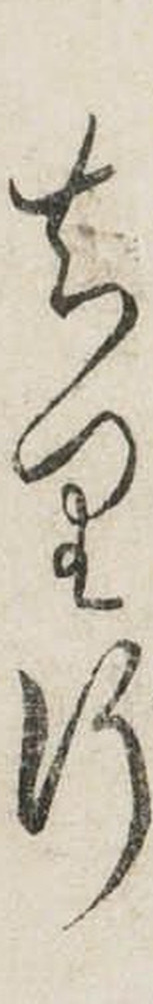ちり行
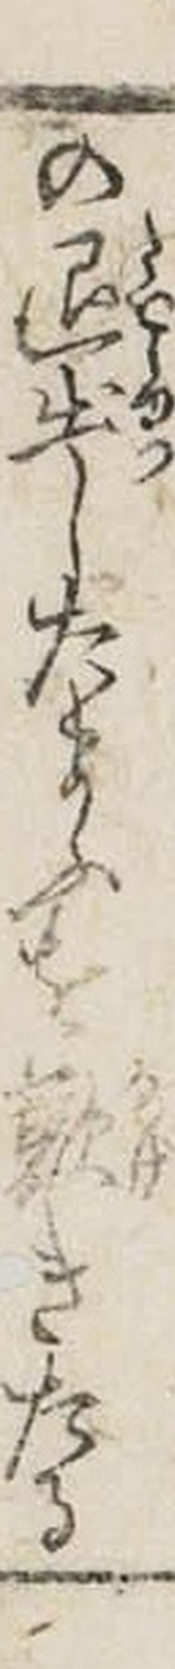の退出したまふを歎きたる
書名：源氏百人一首
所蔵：東京学芸大学教育コンテンツアーカイブ
